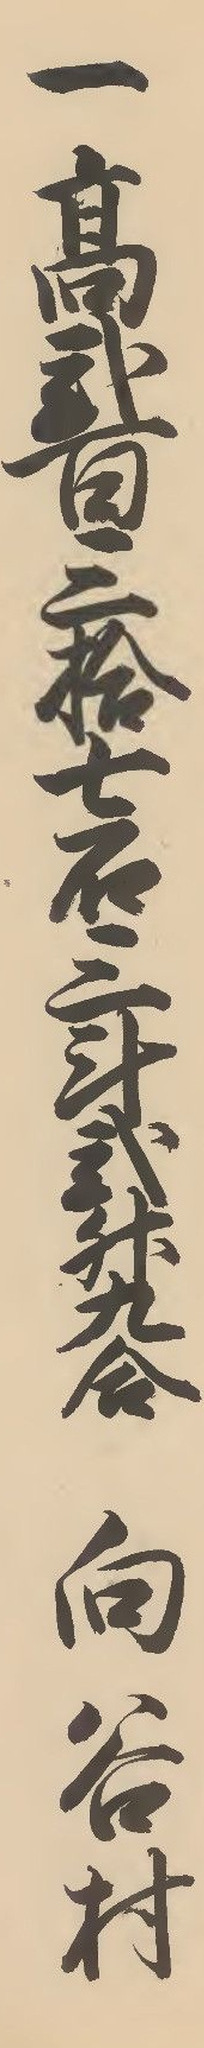一高弐百三拾七石三斗弐升九合向谷村
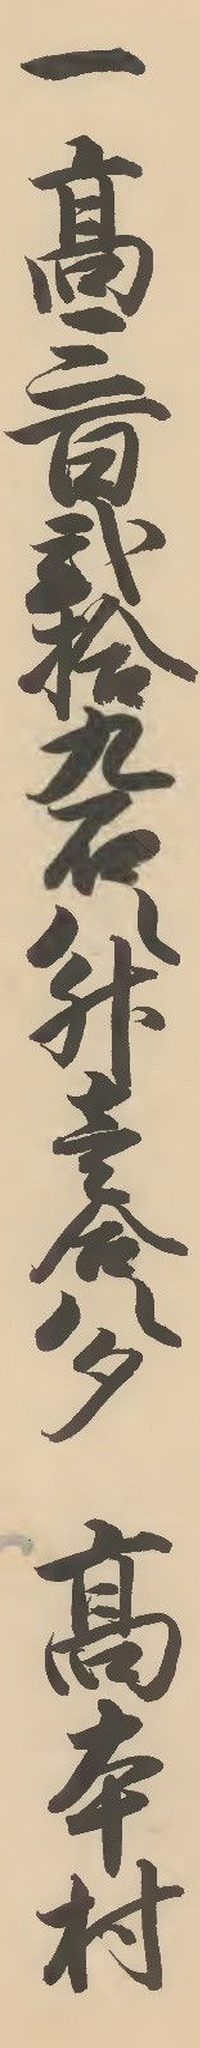一高三百弐拾九石八升壱合八勺高本村

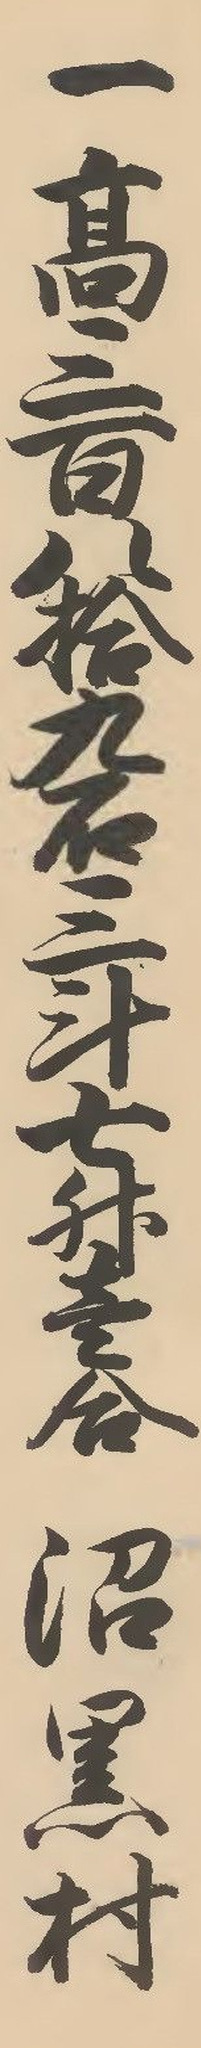一高三百八拾九石三斗七升壱合沼黒村
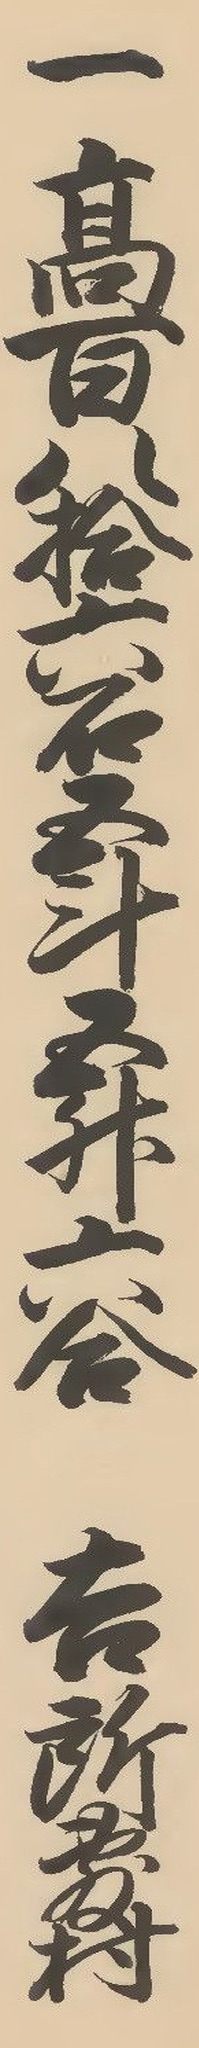一高百八拾六石五斗五升六合吉所敷村
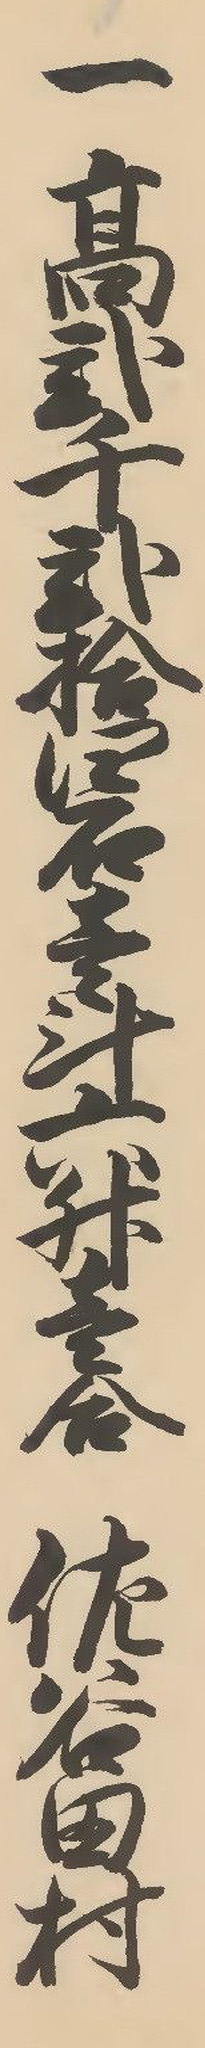一高弐千弐拾四石壱斗六升壱合佐谷田村
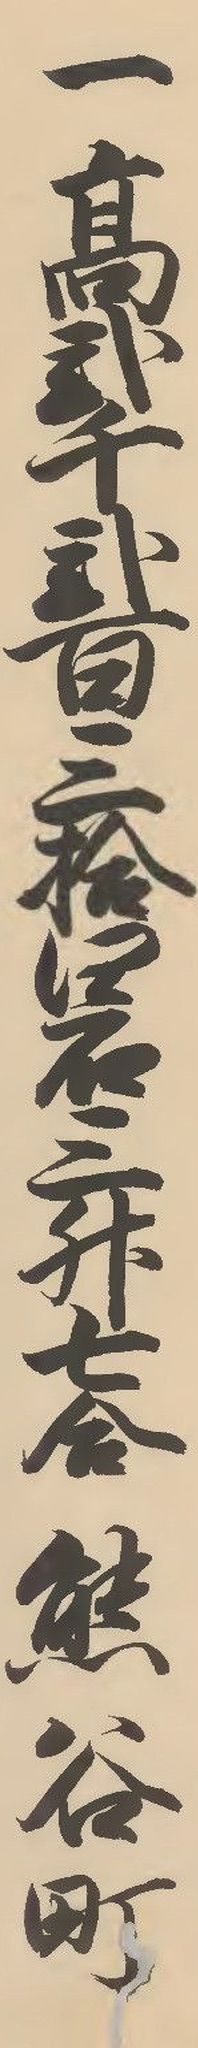一高弐千弐百三拾四石三升七合熊谷町
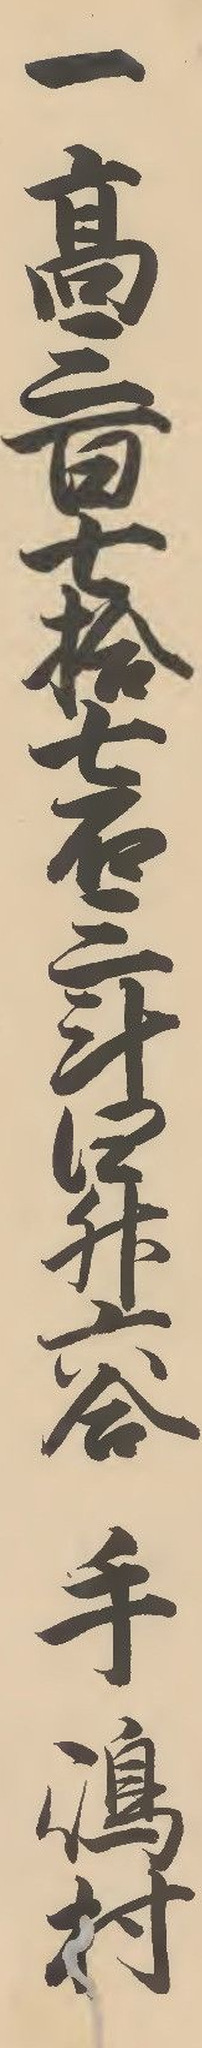一高三百七拾七石三斗四升六合手嶋村
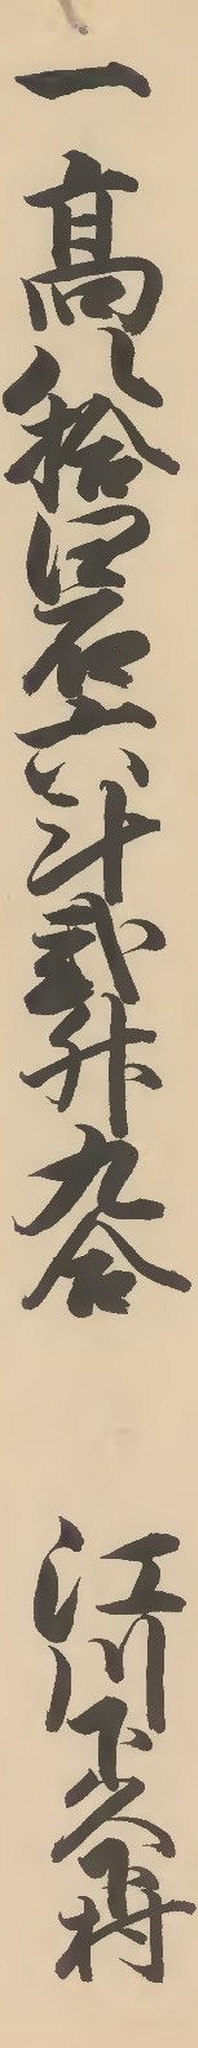一高八拾四石六斗弐升九合江川下久下村
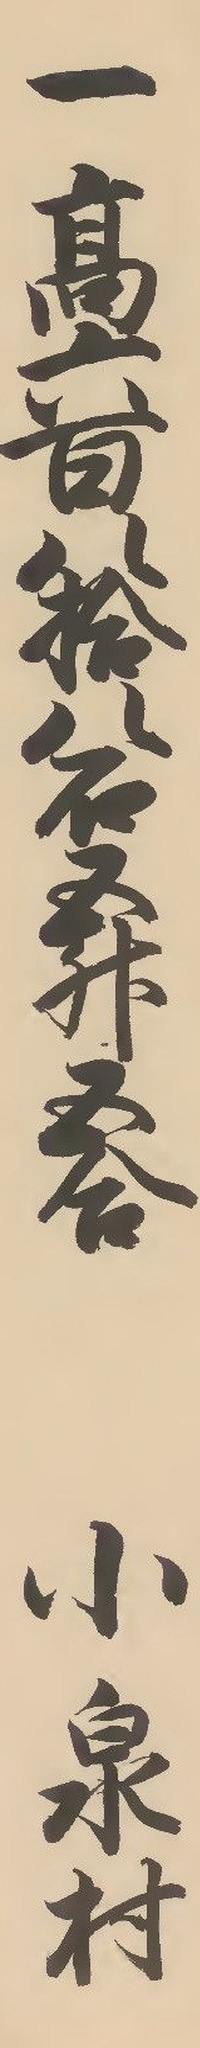一高六百八拾八石五升五合小泉村
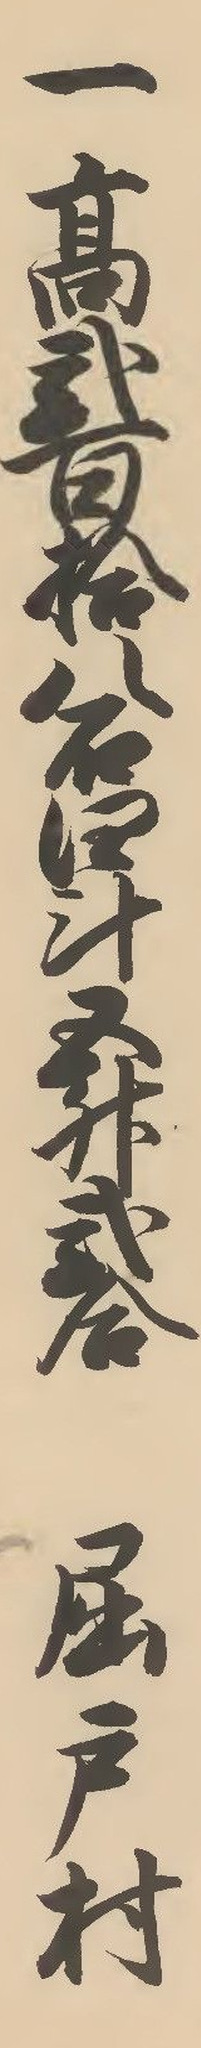一高弐百拾八石四斗五升弐合屈戸村

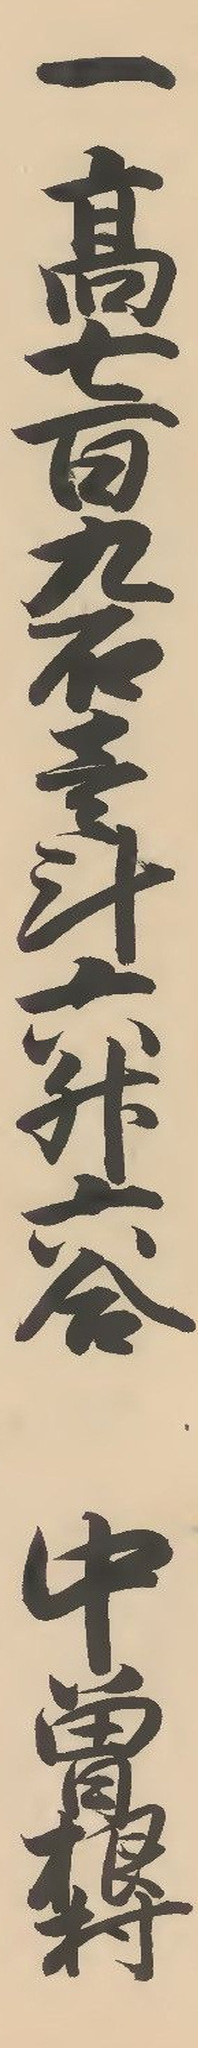一高七百九石壱斗六升六合中曽根村
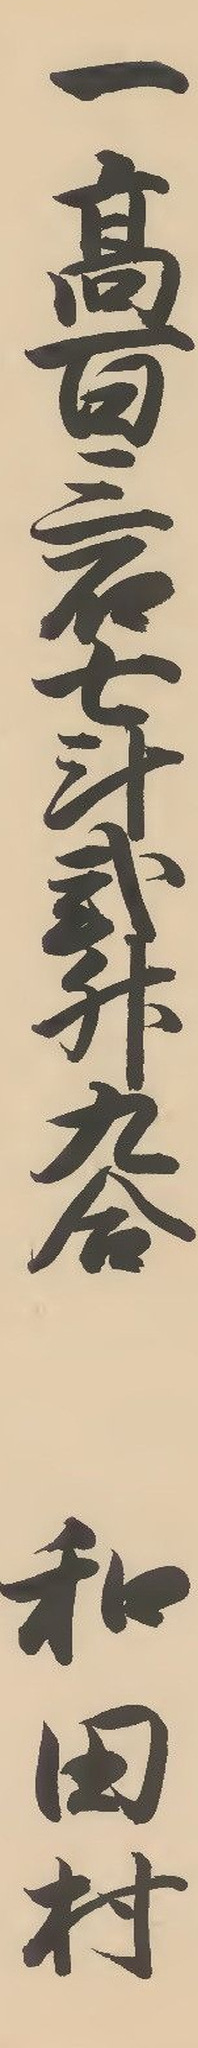一高百三石七斗弐升九合和田村
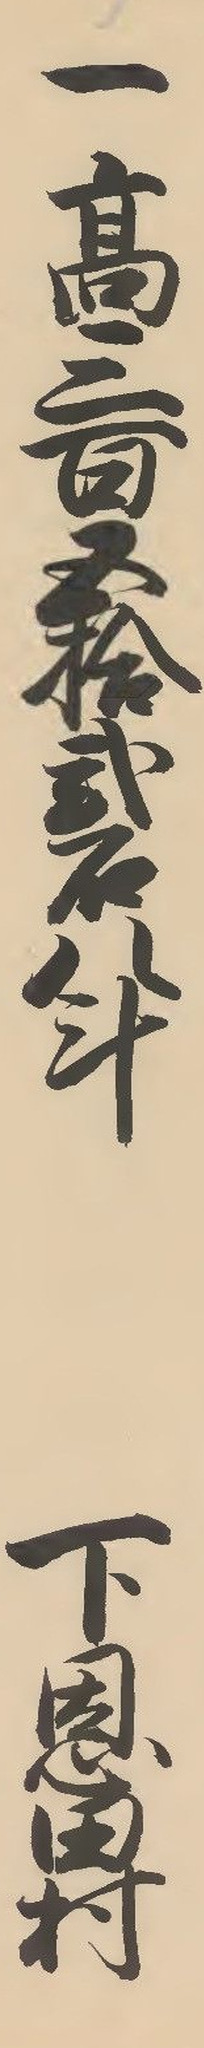一高三百五拾弐石八斗下恩田村
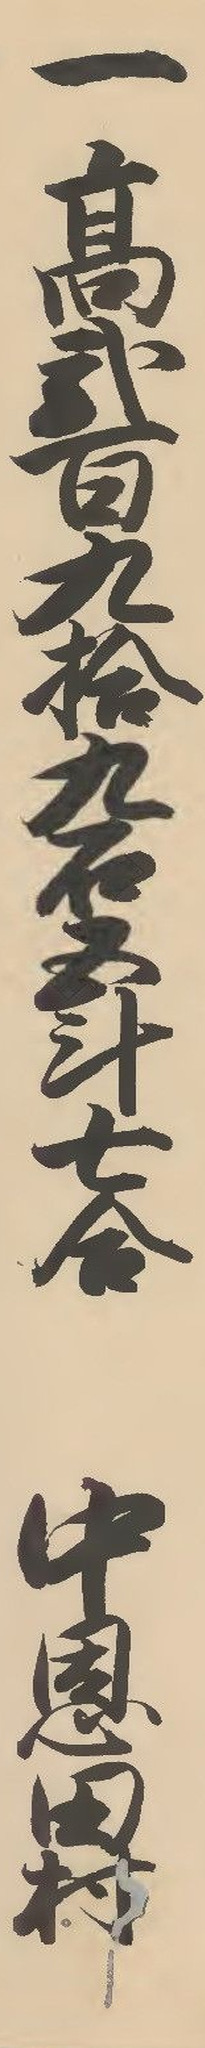一高弐百九拾九石五斗七合中恩田村
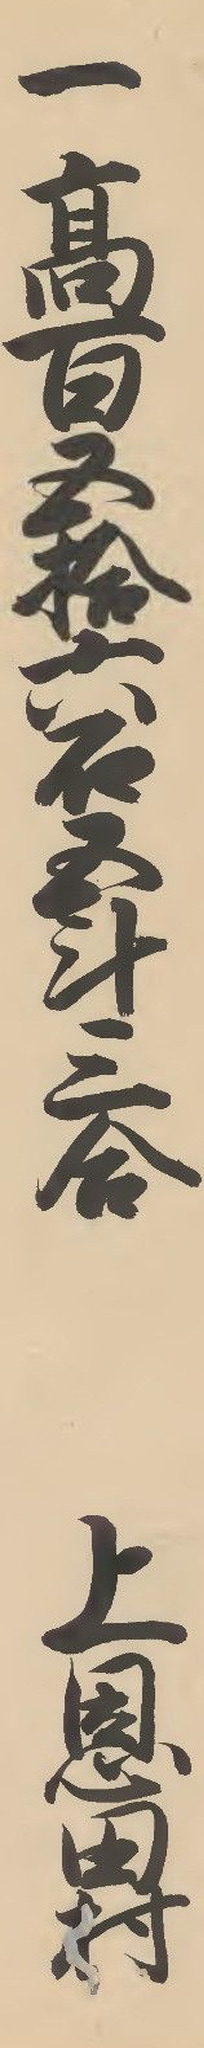一高百五拾六石五斗三合上恩田村
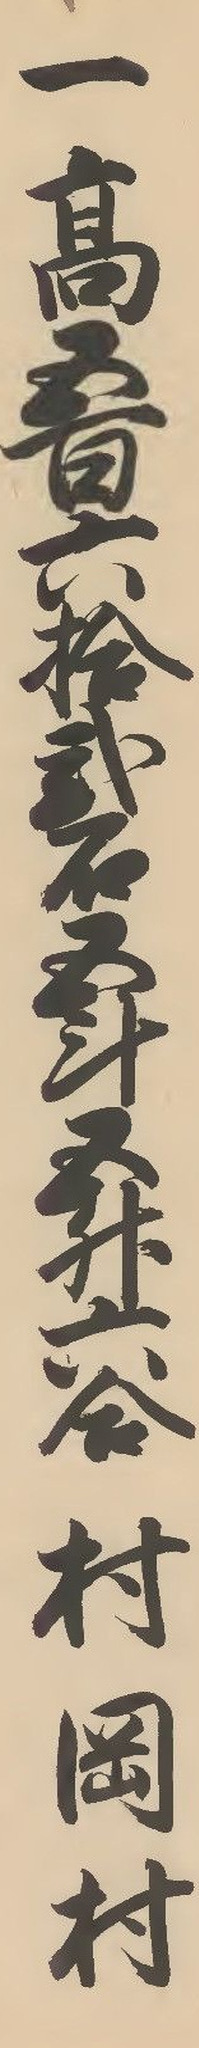一高五百六拾弐石五斗五升六合村岡村
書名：武蔵国郷帳　上
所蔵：国立公文書館 National Archives of Japan
